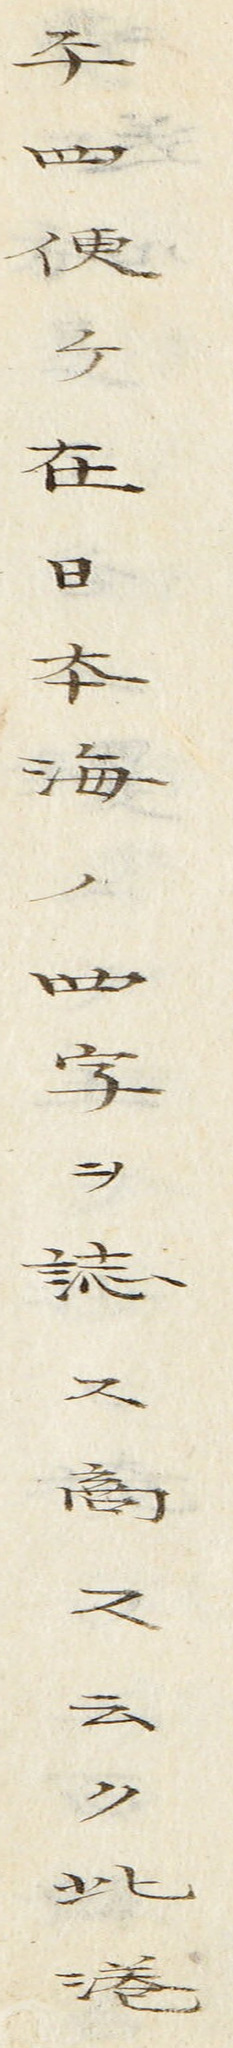平四便チ在日本海ノ四字ヲ誌ス商又云ク此港
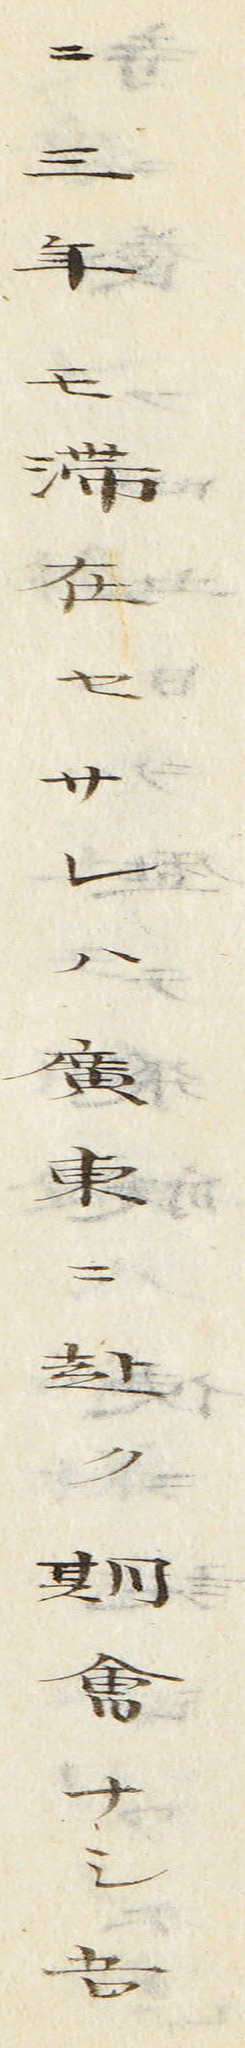ニ三年モ滞在セサレハ広東ニ赴ク期会ナシ吾
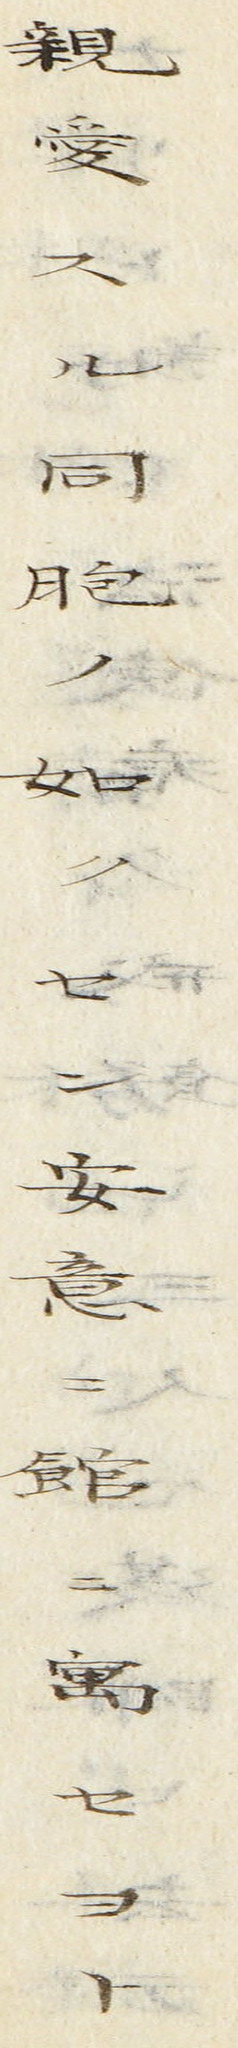親愛スル同胞ノ如クセン安意ニ館ニ寓セヨト
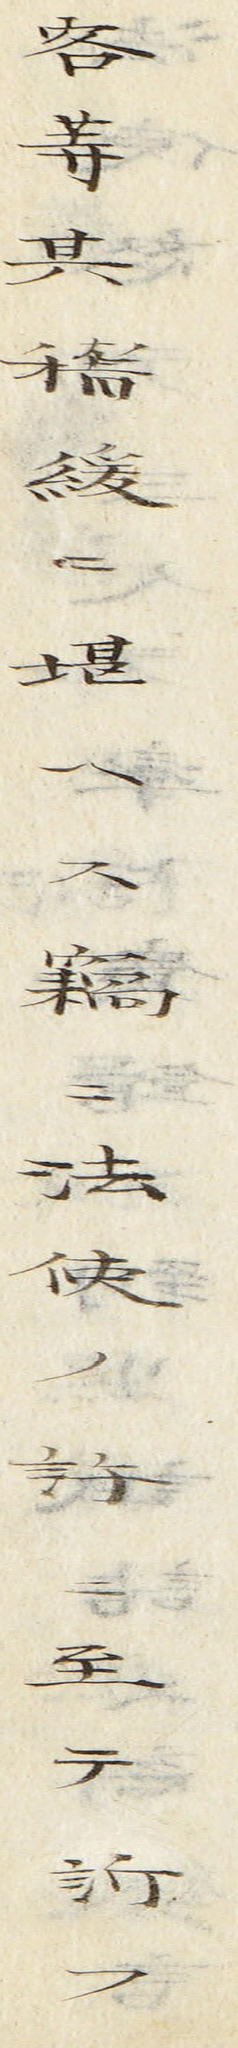客等其稽緩ニ堪ヘス竊ニ法使ノ許ニ至テ訴フ

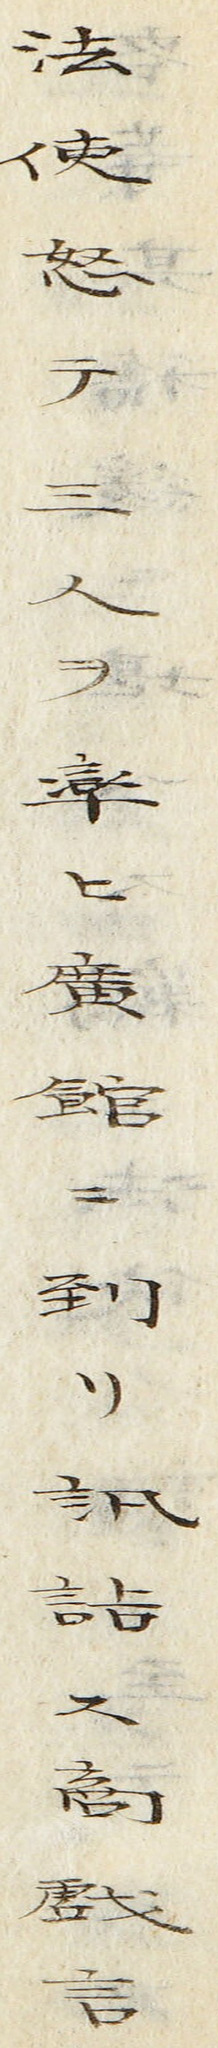法使怒テ三人ヲ率ヒ広館ニ到リ訊詣ス商戯言
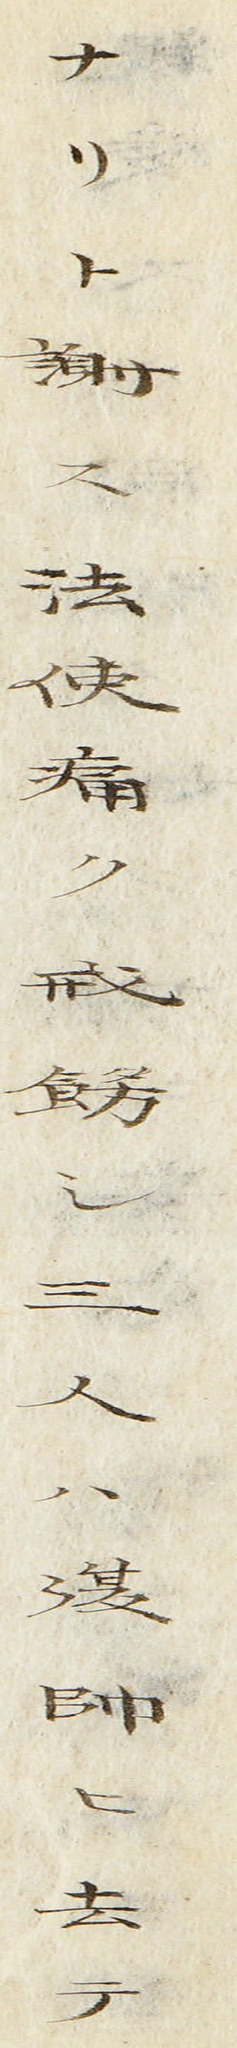ナリト謝ス法使痛ク戒餝シ三人ハ復帥ヒ去テ
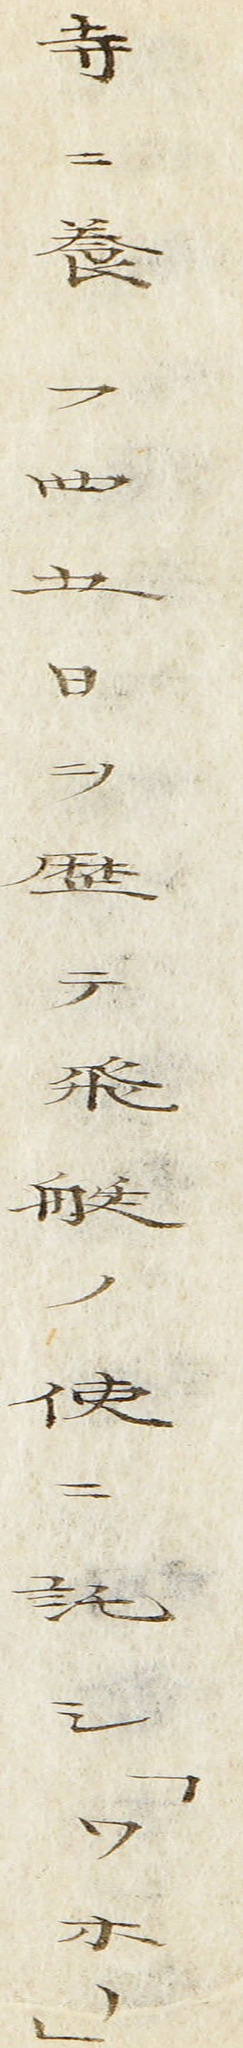寺ニ養フ四五日ヲ歴テ飛艇ノ使ニ託シ「ワホー」
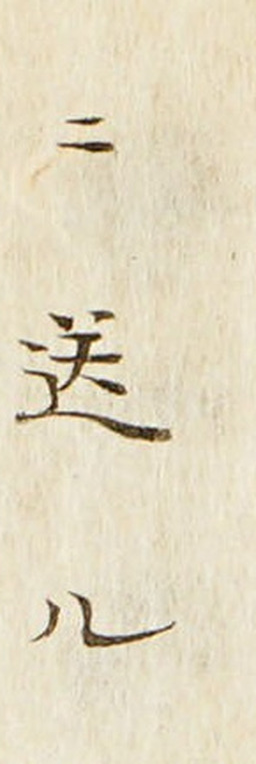ニ送ル
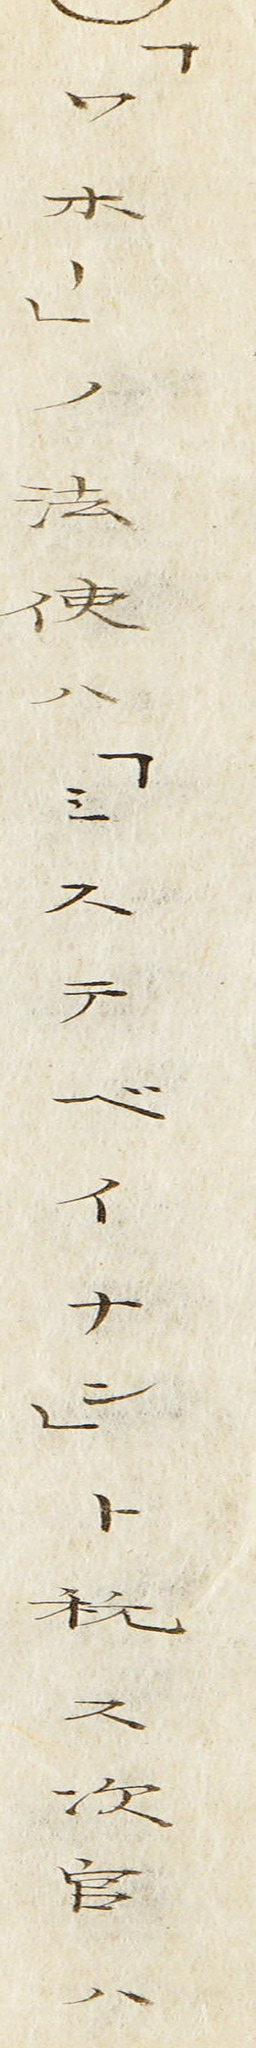○「ワホー」ノ法使ハ「ミステベイナン」トス次官ハ
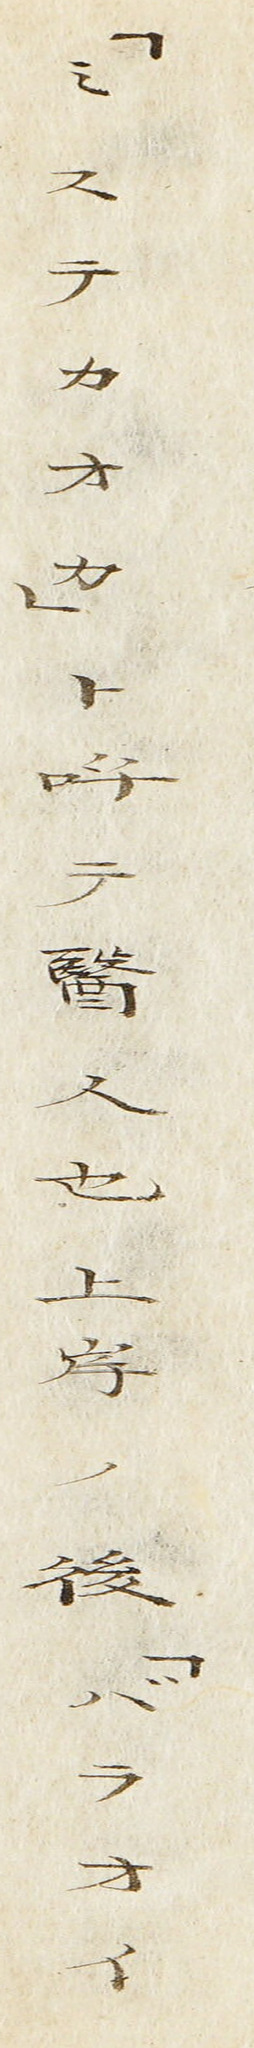「ミステカオカ」と呼テ医人也上岸ノ後「バラオイ
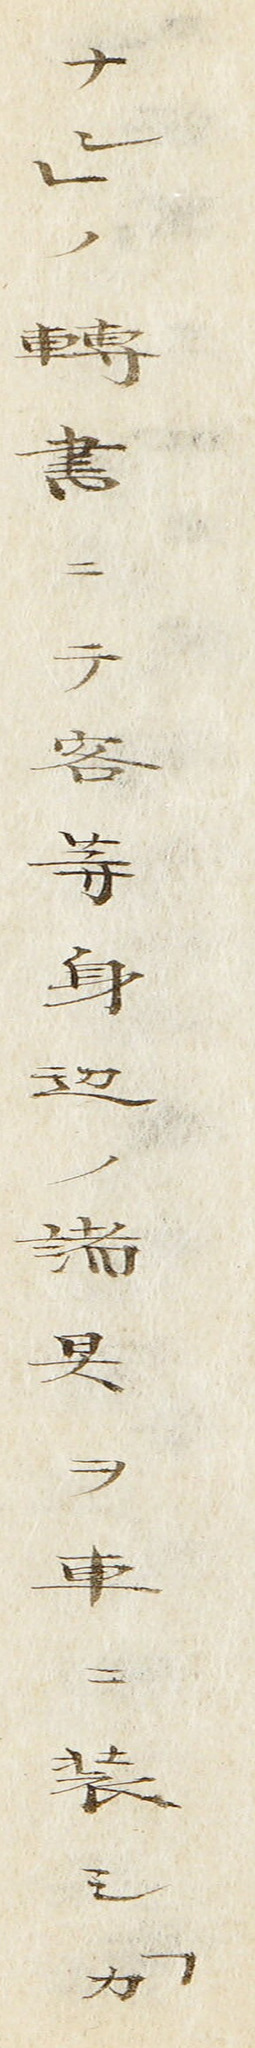ナン」ノ転書ニテ客等身辺ノ諸旲ヲ車ニ装シ「カ
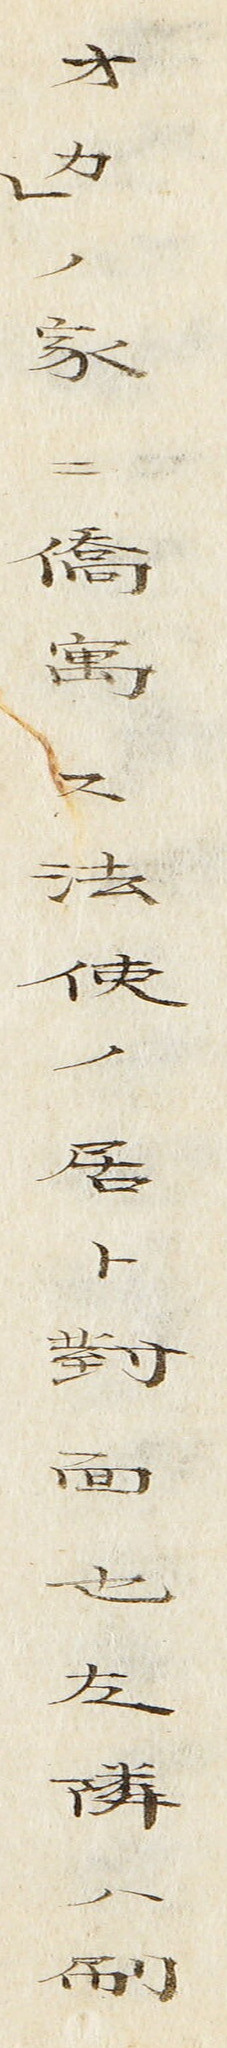オカ」ノ家ニ僑寓ス法使ノ居ト対面也左隣ハ刷
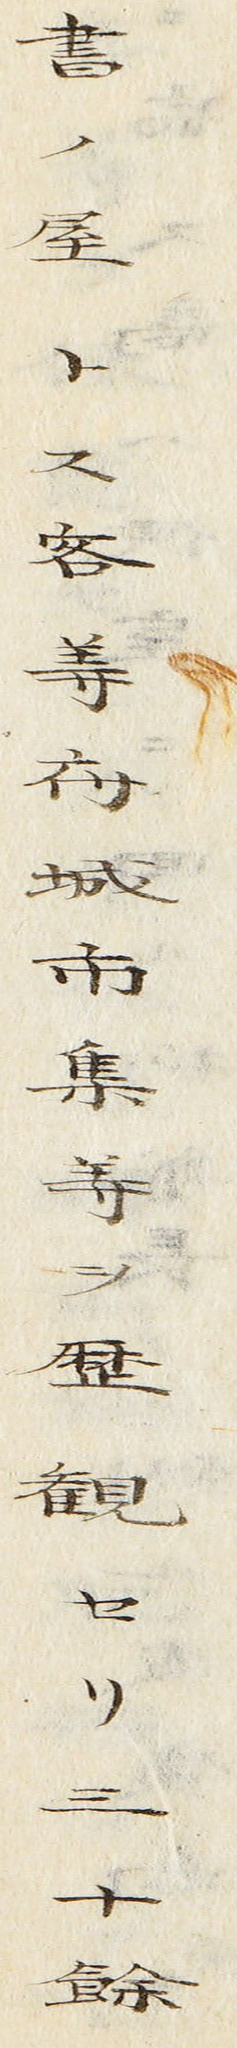書ノ屋トス客等府城市集等ヲ歴観セリ三十余
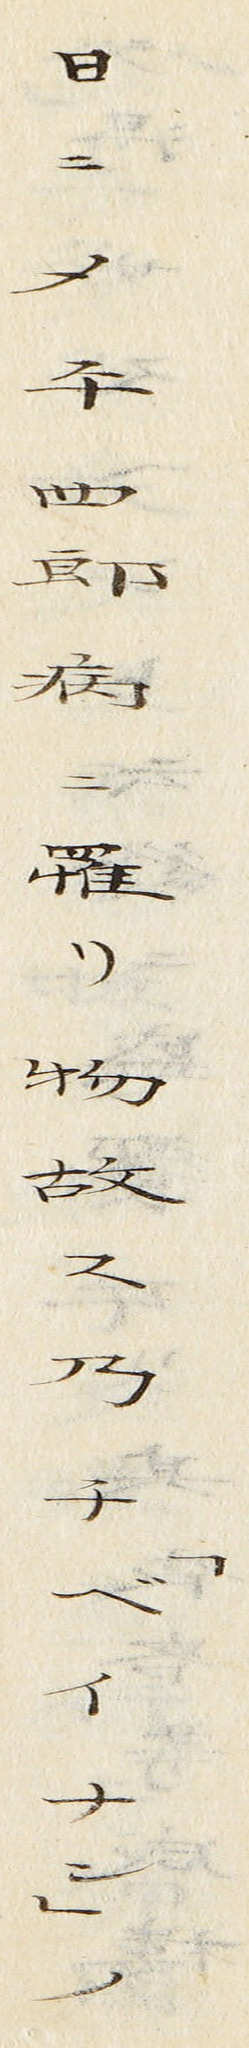日ニシテ平四郎病ニ罹リ物故ス乃チ「ベイナン」ノ
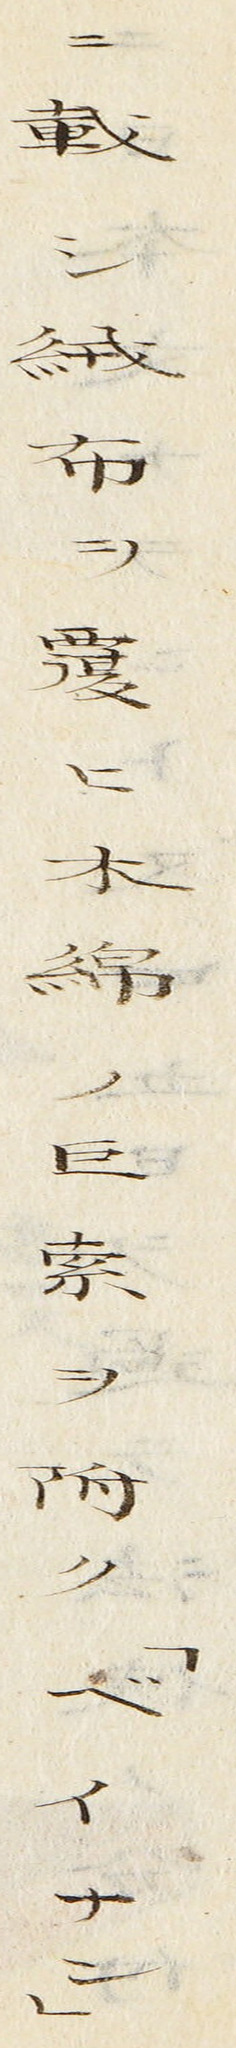ニ載シ絨布ヲ覆ヒ木綿ノ巨索ヲ附ク「ベイナン」
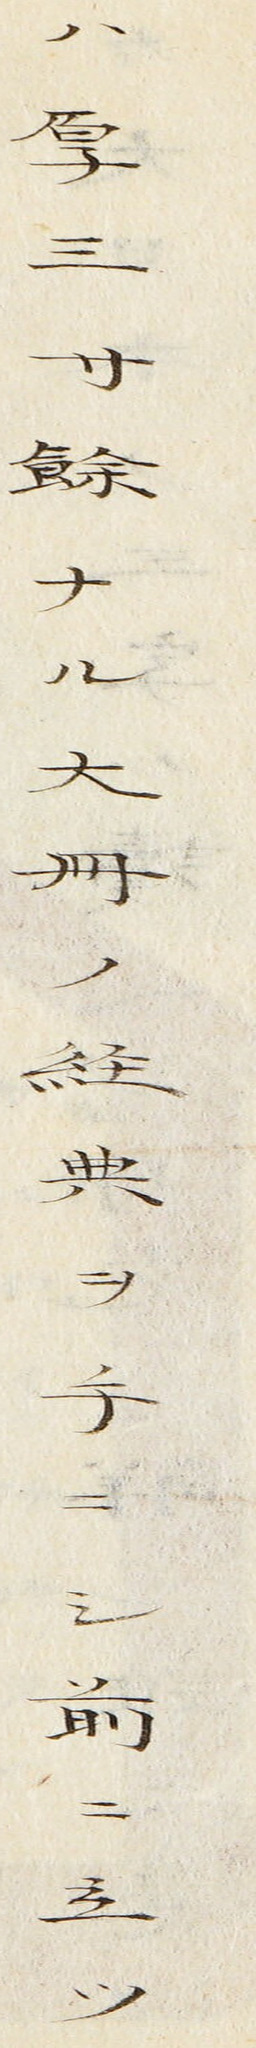ハ厚三寸余ナル大冊ノ経典ヲ手ニシ前ニ立ツ
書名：蕃談
